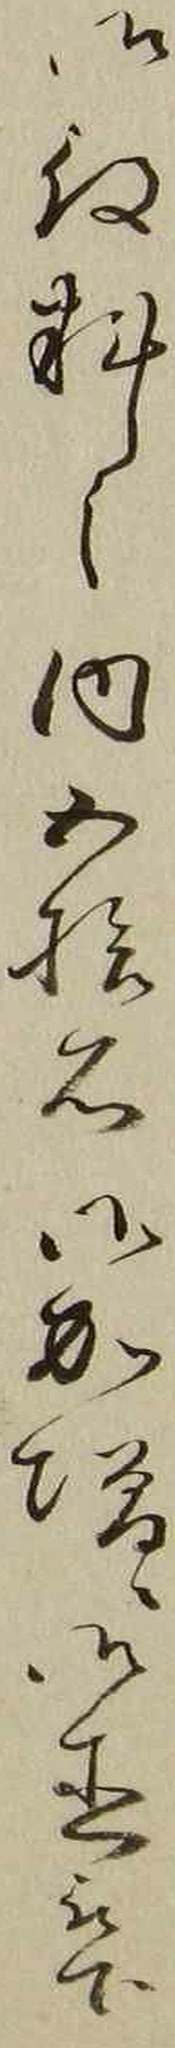御役料之内五拾石御加増ニ御直被下
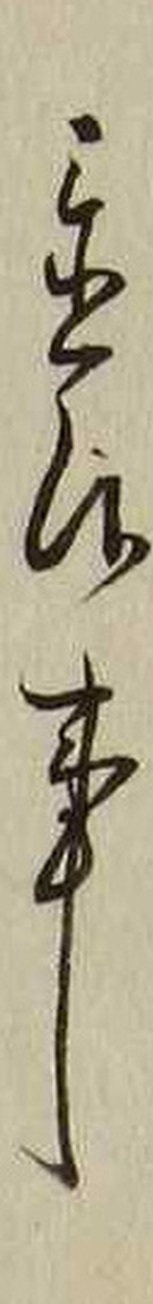置候事
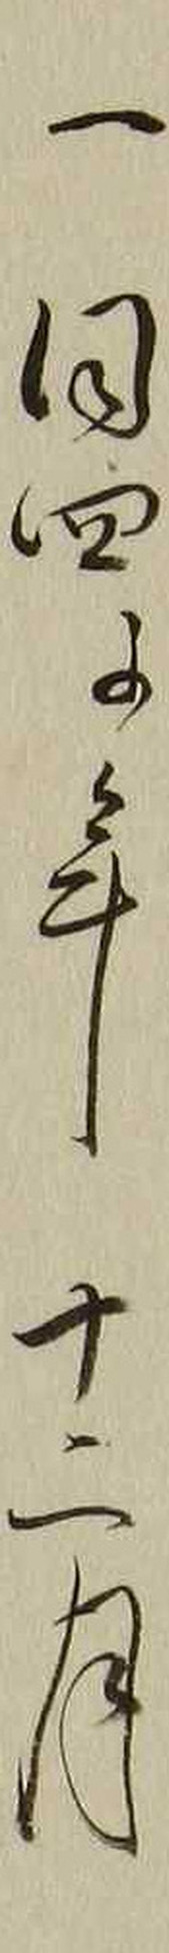一同四子年十二月
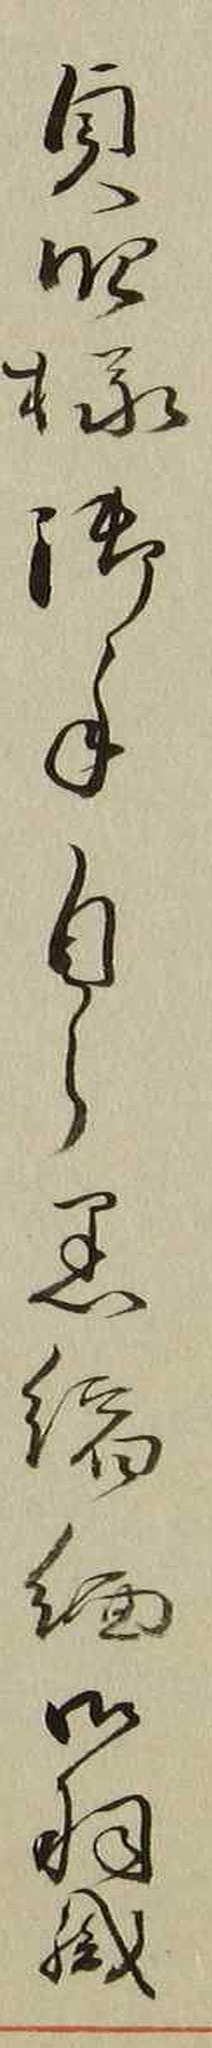貞昭様御手自ら黒縮緬御羽織
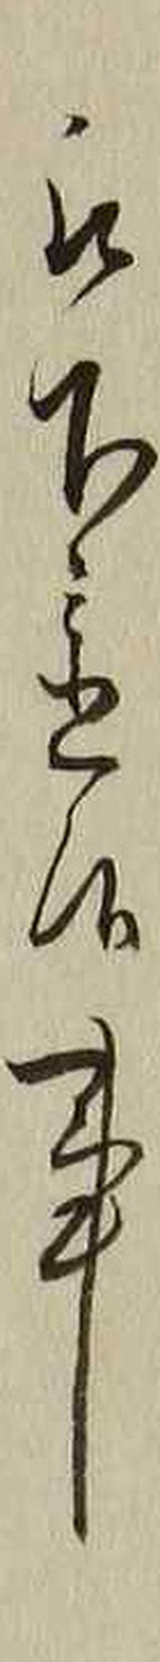被下置候事
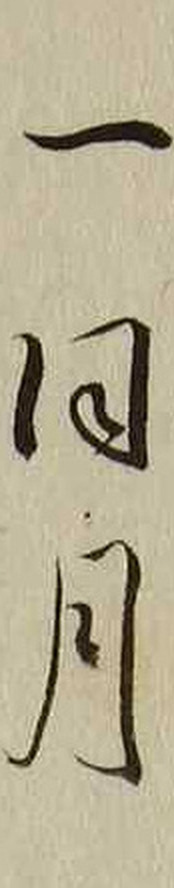一同月
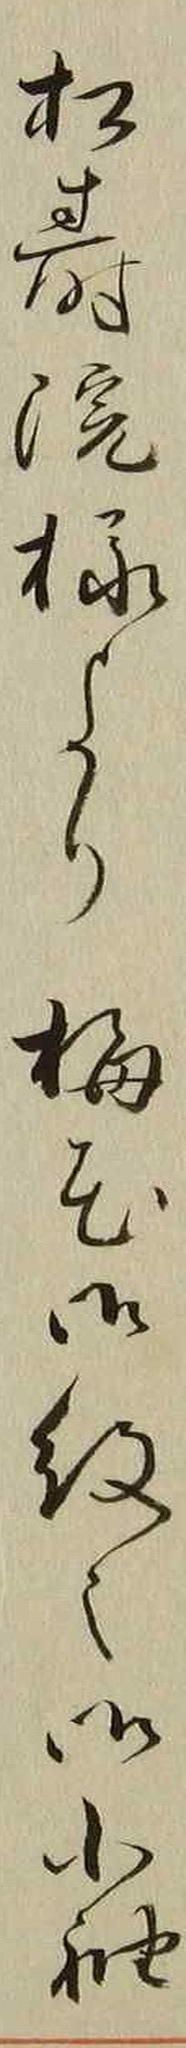松寿院様より梅花御紋之御小袖
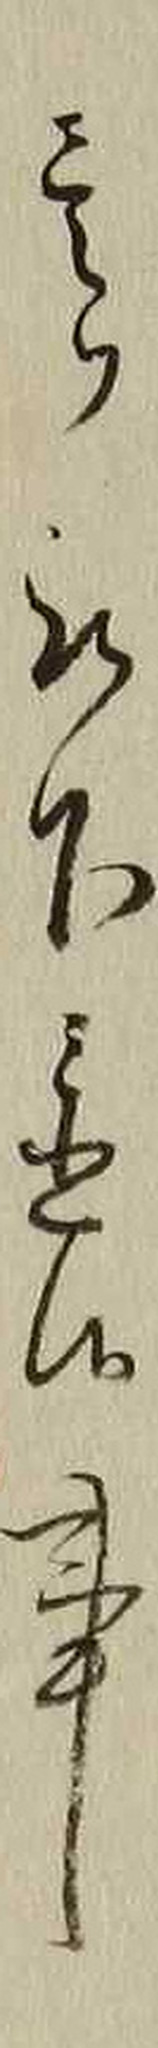壱ツ被下置候事
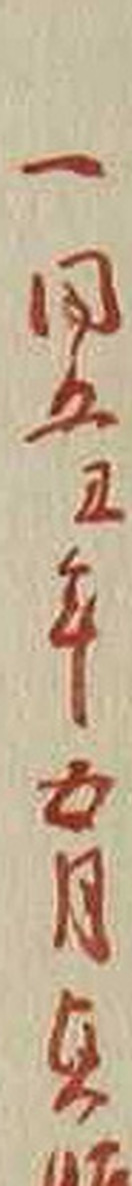一同五丑年八月
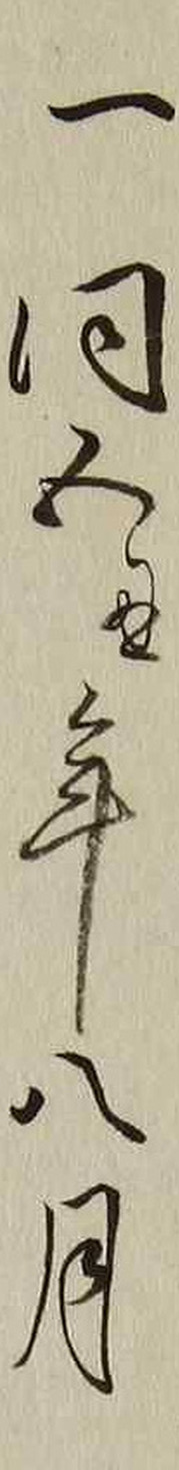一同五丑年八月
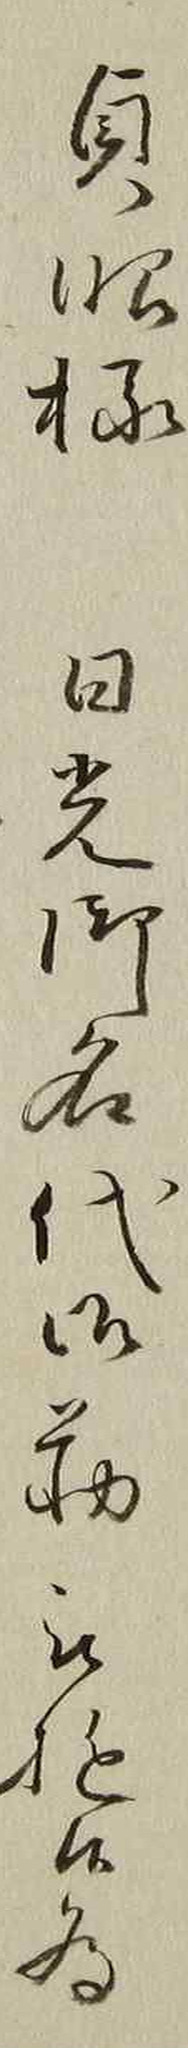貞昭様日光御名代御勤被遊候為
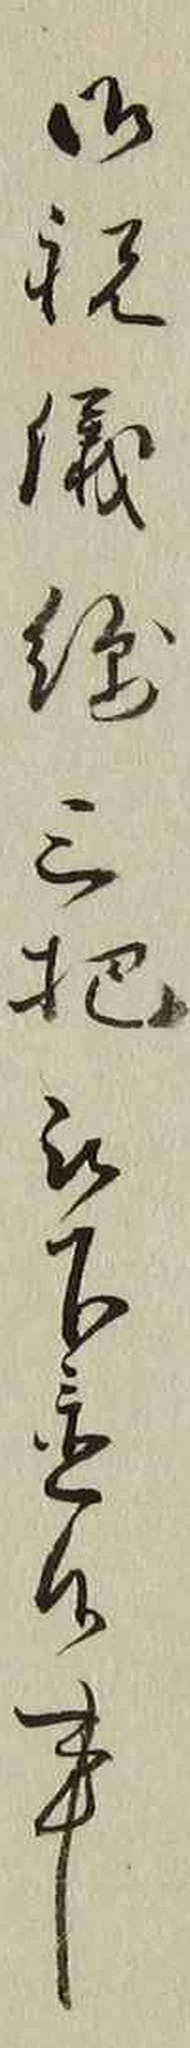御祝儀綿三把被下置候事
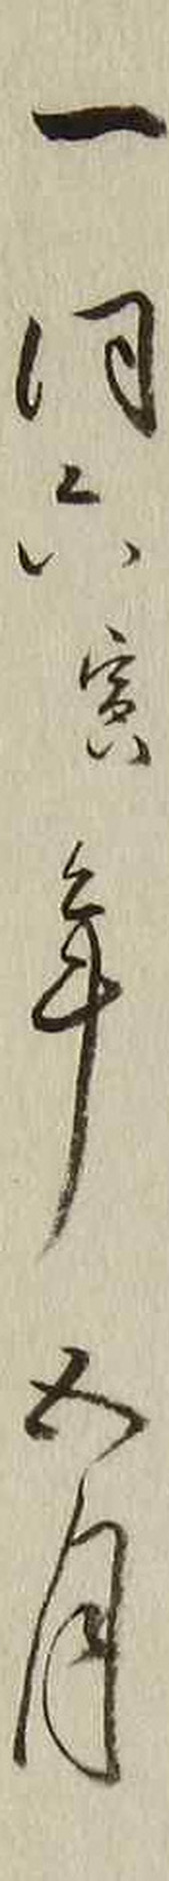一同六寅年五月
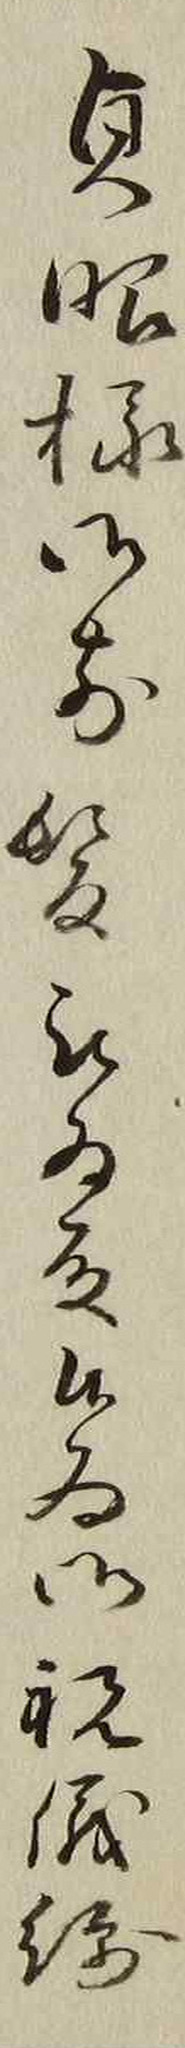貞昭様御前髪被為取候為御祝儀綿
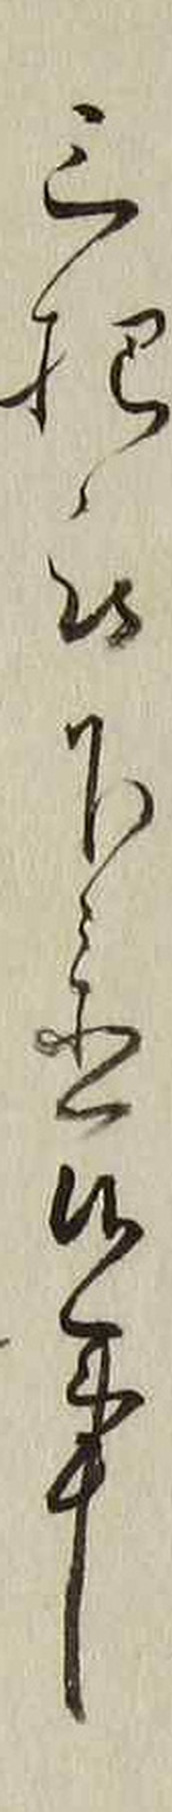三把被下置候事
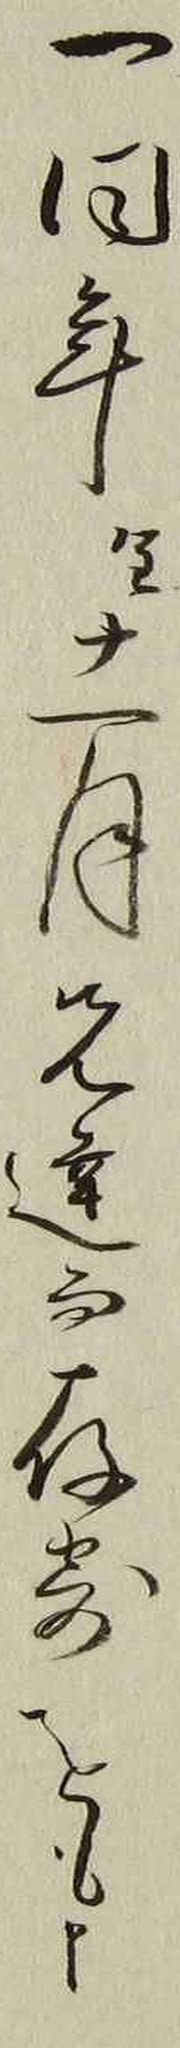一同年閏十一月先達而存寄をも申
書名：諸士系譜　巻之2　い之部2
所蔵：会津若松市立会津図書館
